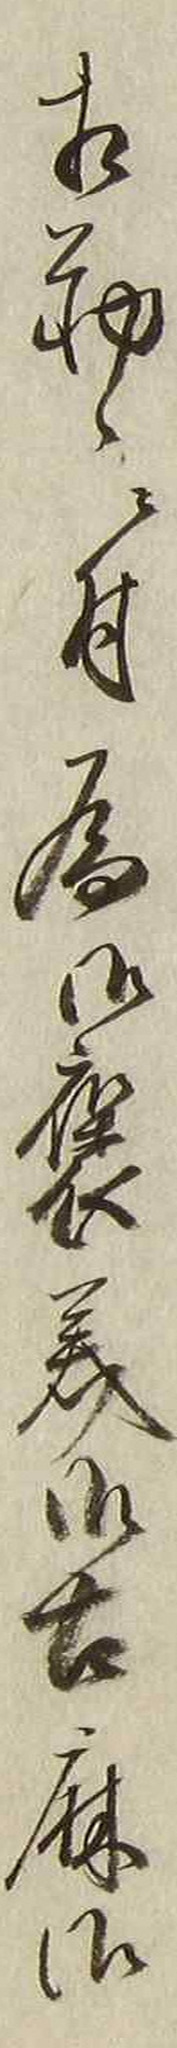相勤候ニ付為御褒美御古麻御
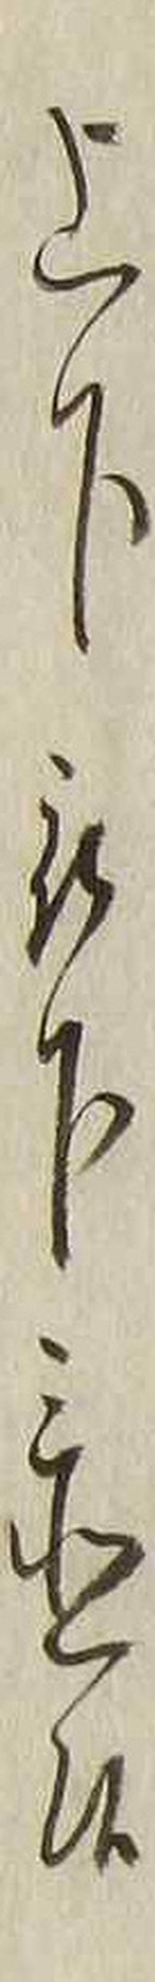上下被下置候

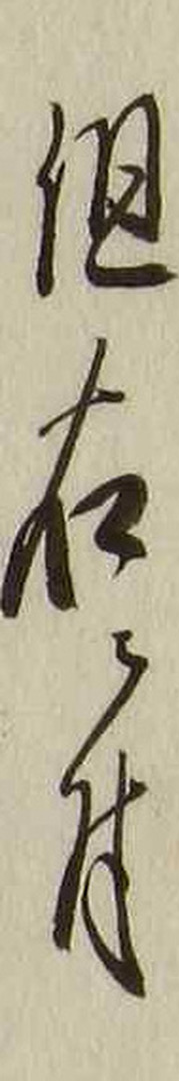但右ニ付
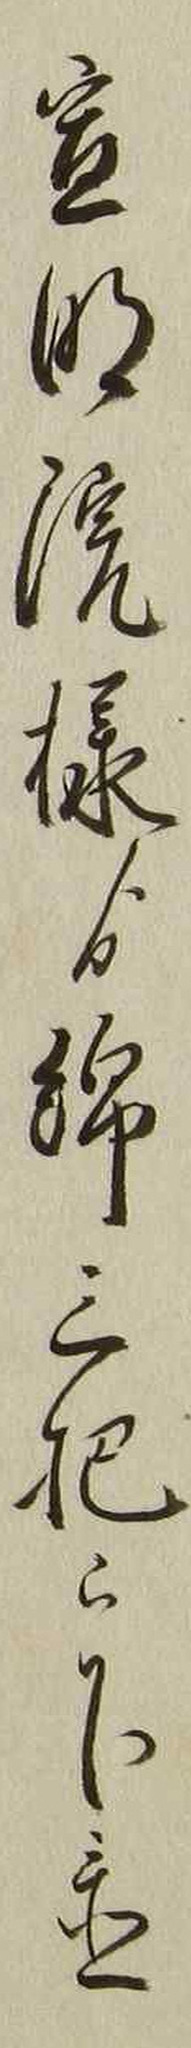宣明院様ゟ綿三把被下置
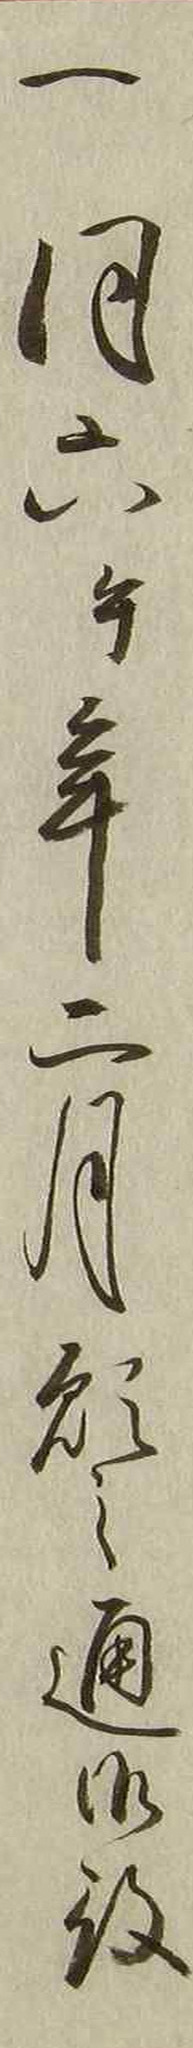一同六午年二月願之通御役
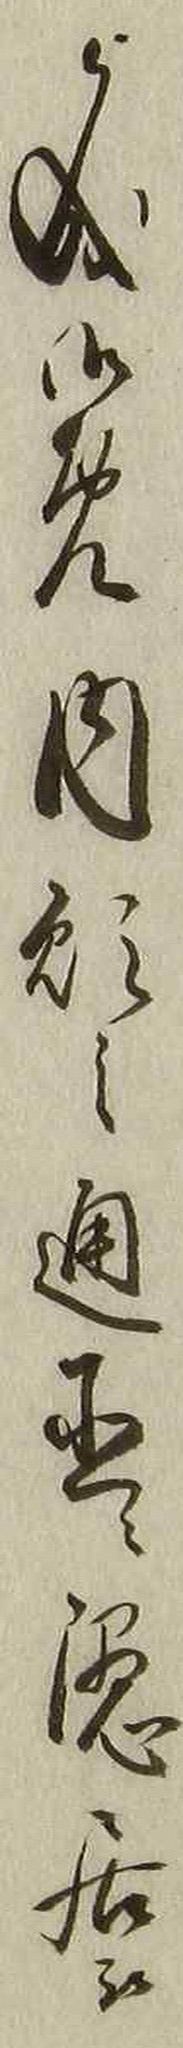被成御免内願之通直ニ隠居被
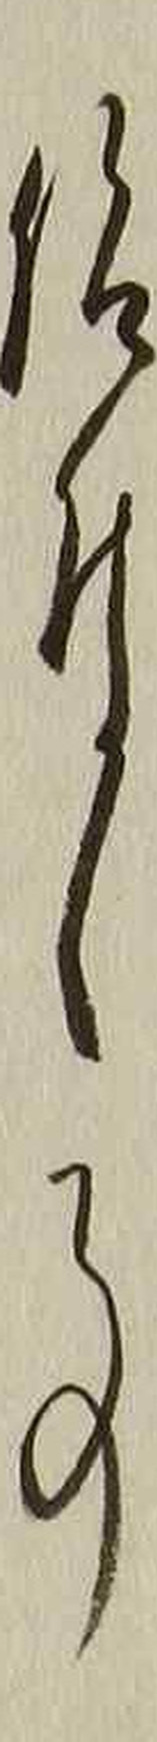仰付候事
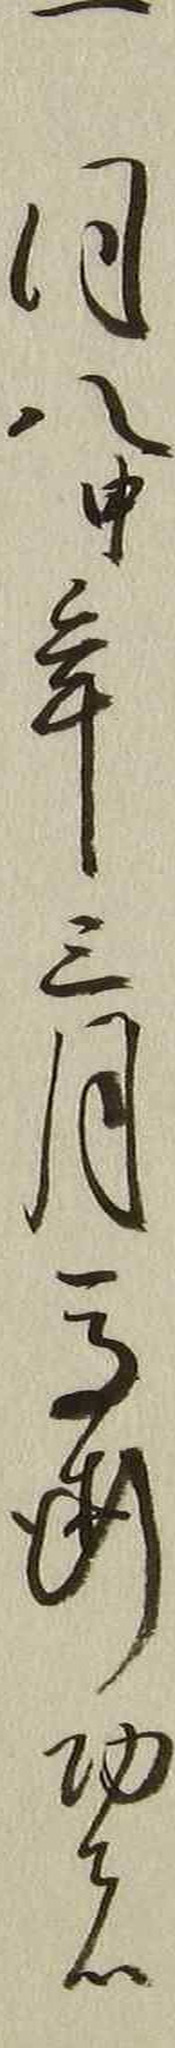一同八申年三月馬術功者
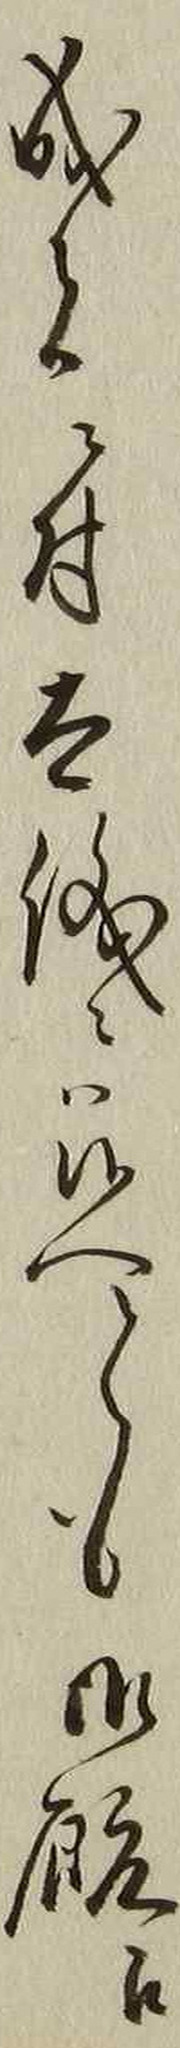成者ニ付太儀ニハ候へとも御厩江
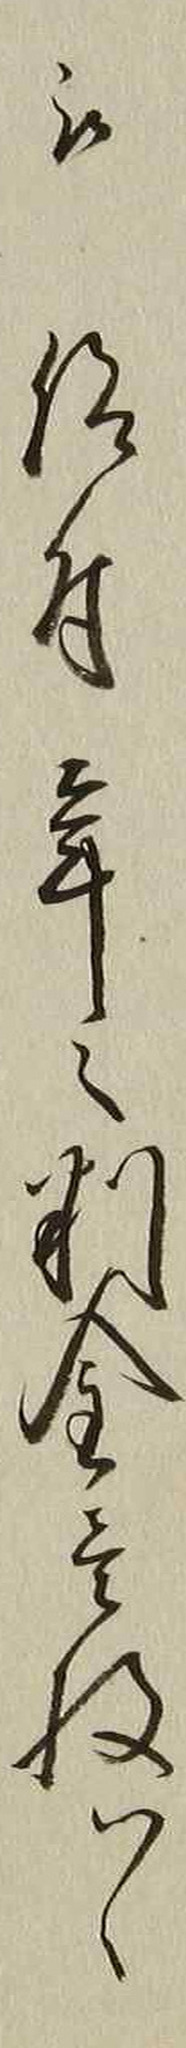被仰付年々判金壱枚ツヽ
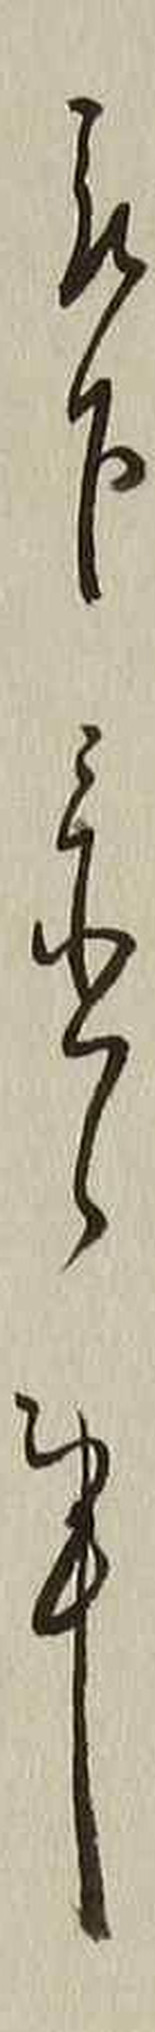被下置候事
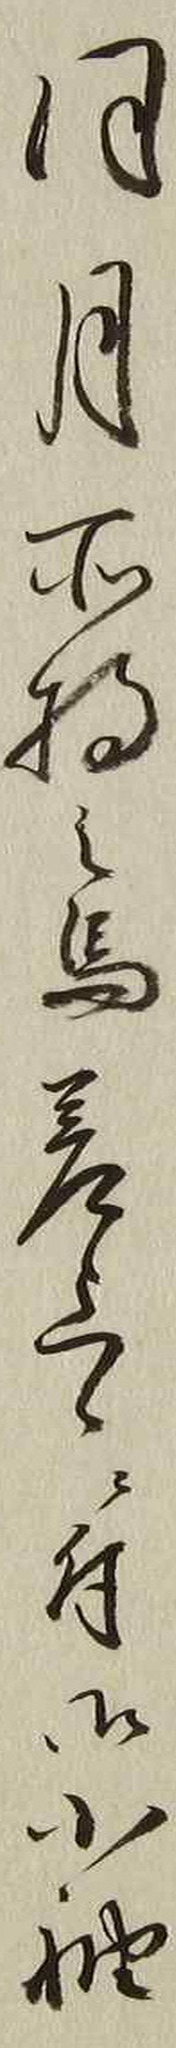同月所持之馬差上候ニ付小袖
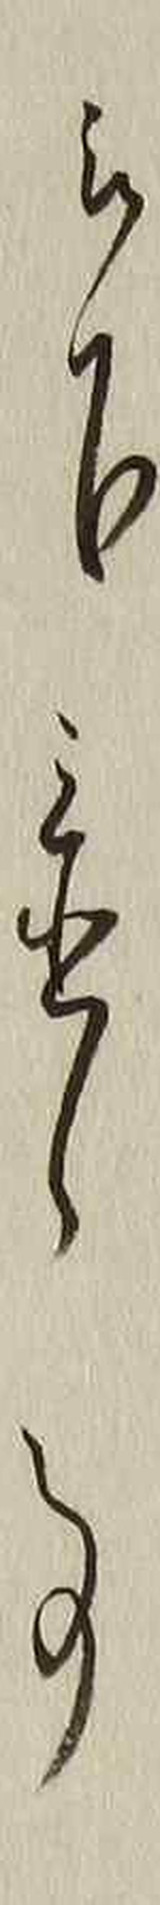被下置候事
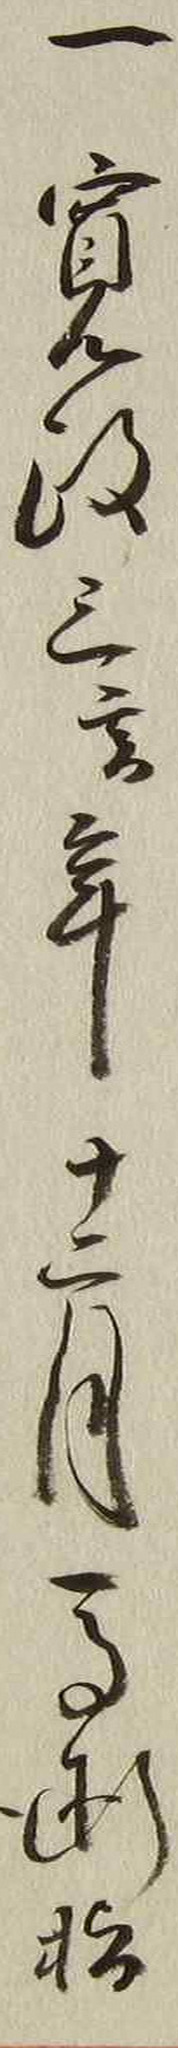一寛政三亥年十二月馬術指
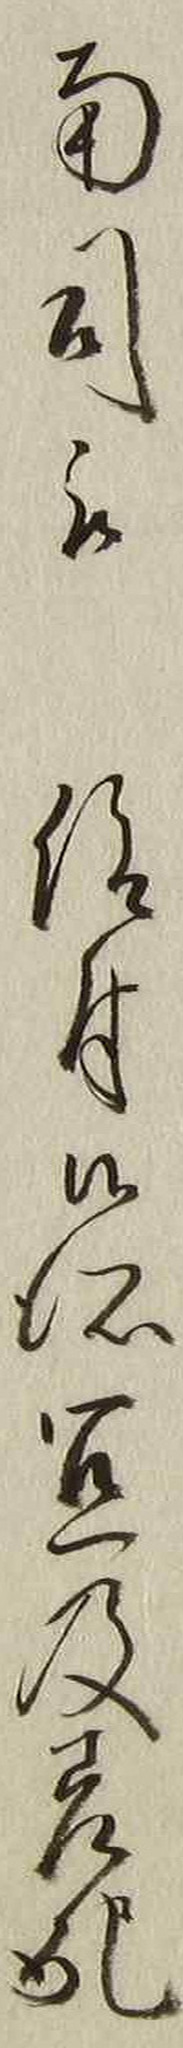南司被仰付候所宜及差配
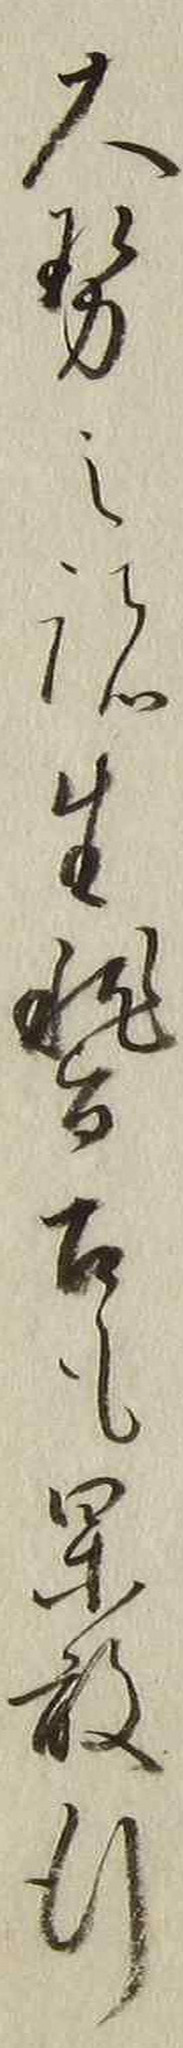大勢之諸生稽古果敢行
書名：諸士系譜　巻之18　い之部18
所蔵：会津若松市立会津図書館
